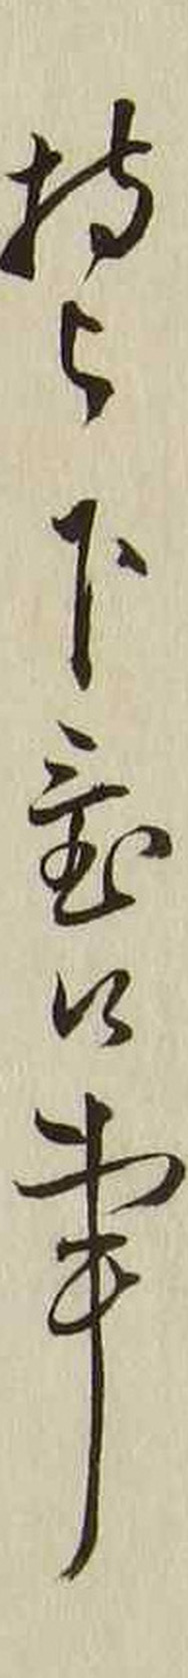持被下置候事
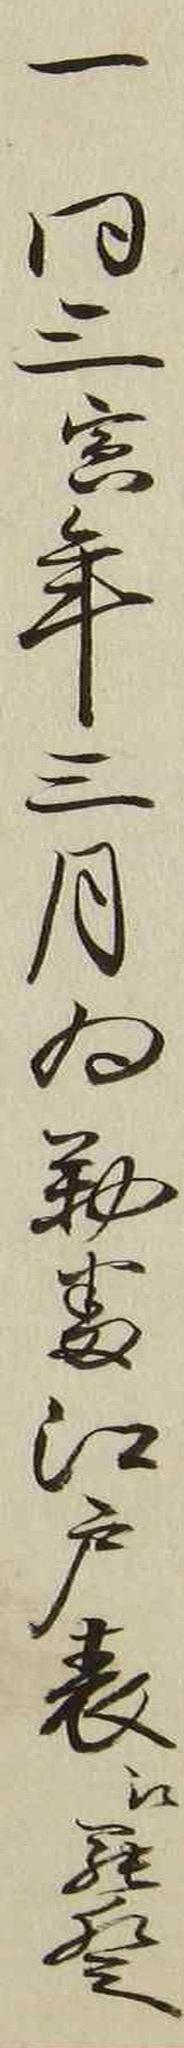一同三寅年三月為勤番江戸表江罷登
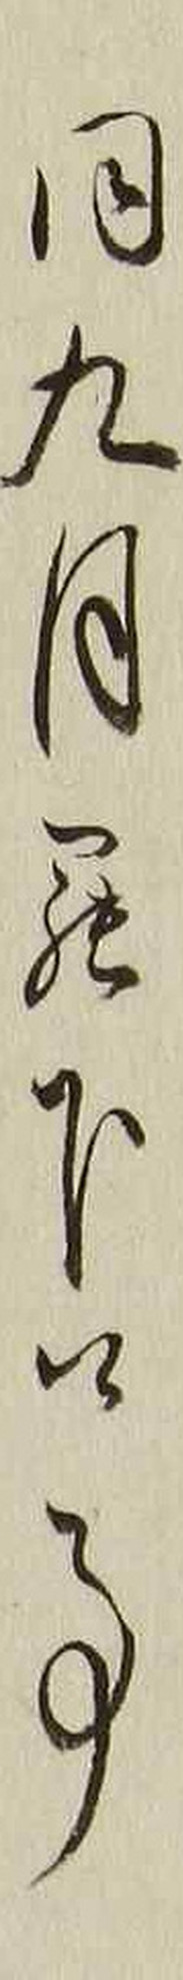同九月罷下候事
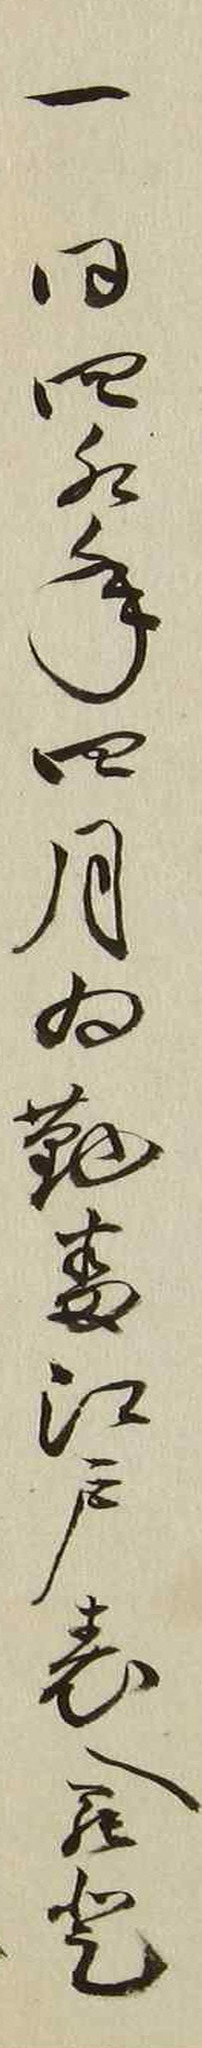一同四卯年四月為勤番江戸表へ罷登
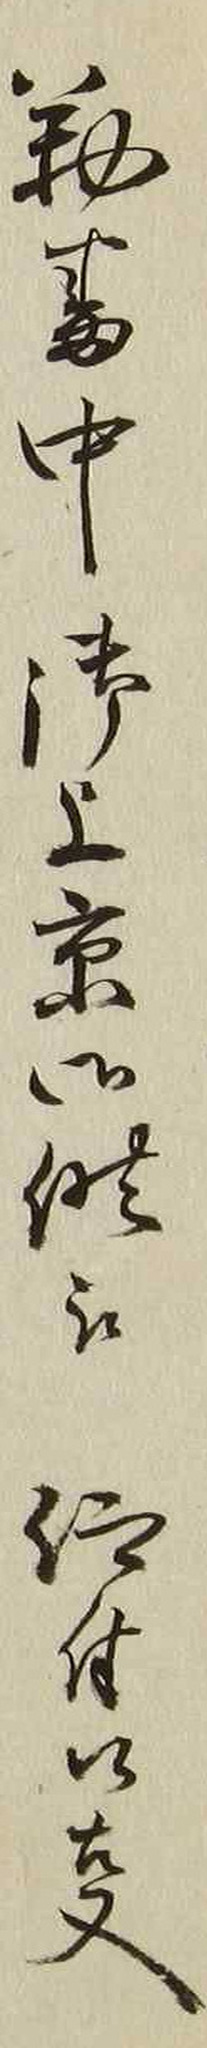勤番中御上京御供被仰付候事
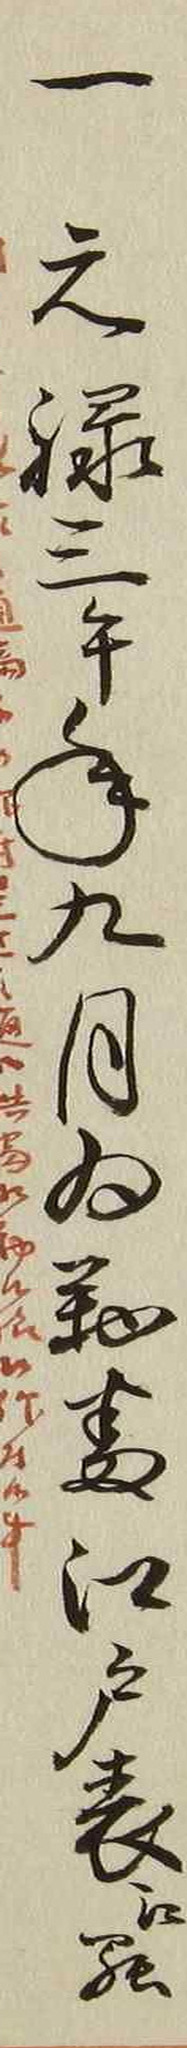一元禄三午年九月為勤番江戸表江罷
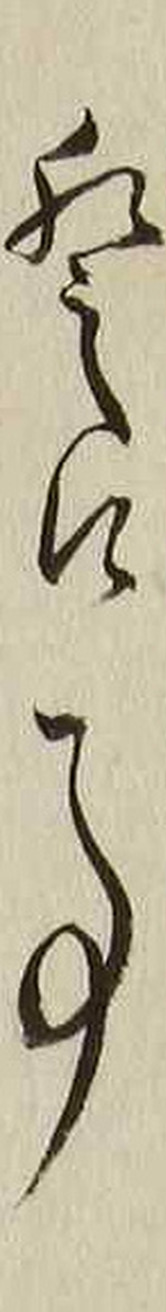登候事
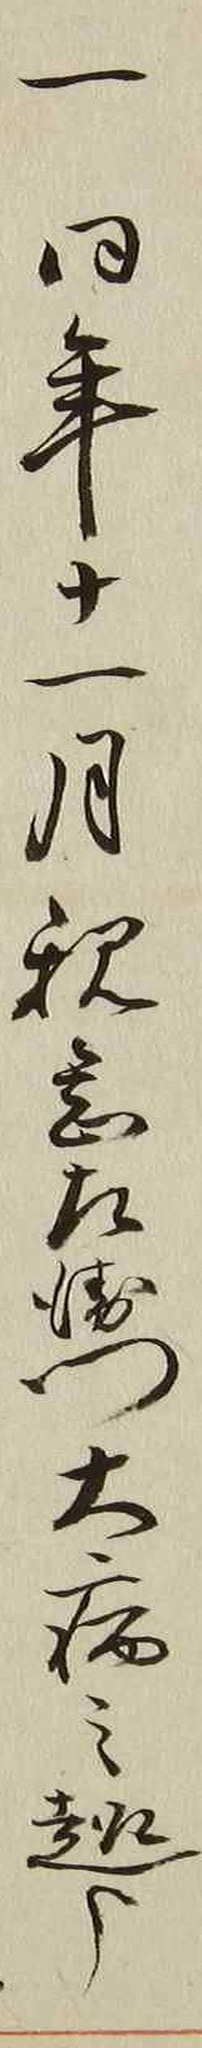一同年十一月親甚左衛門大病之趣申
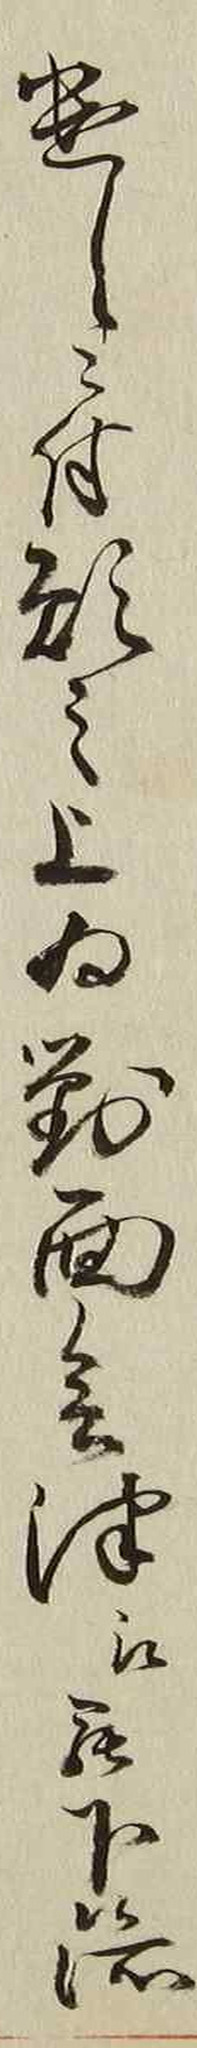遣し候ニ付願之上為対面会津江罷下候所
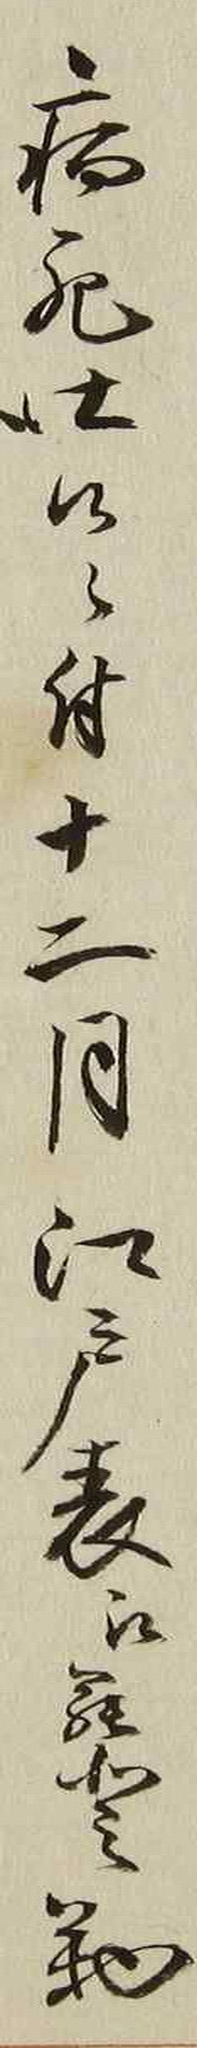病死仕候ニ付十二月江戸表江罷登勤
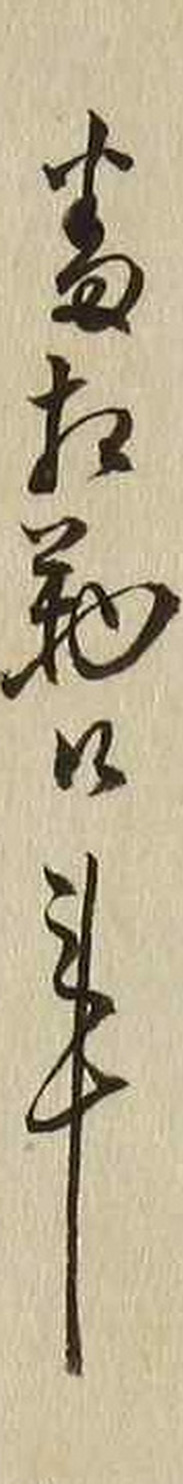番相勤候事
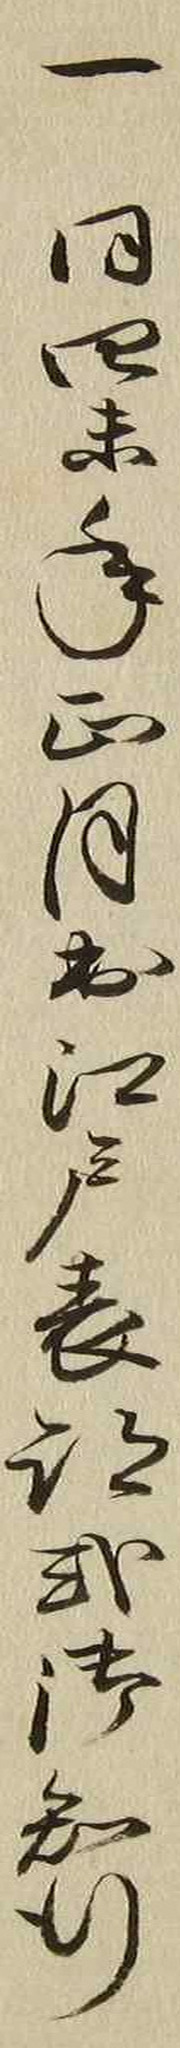一同四未年正月於江戸表跡式御知行
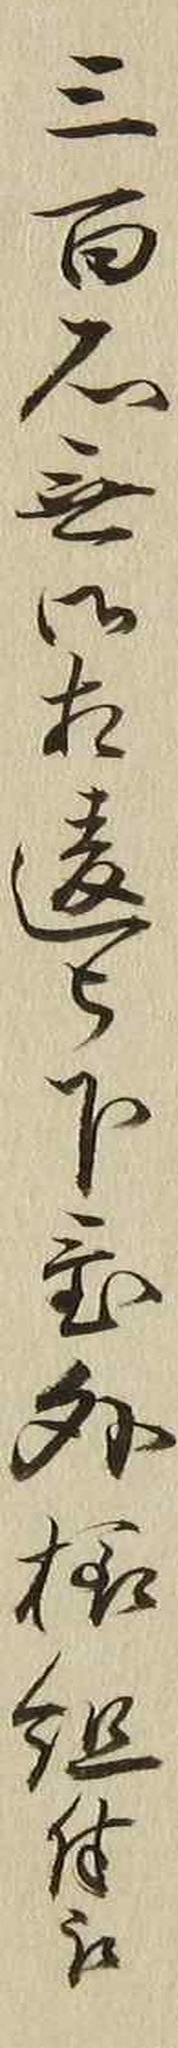三百石無御相違被下置外様組付被
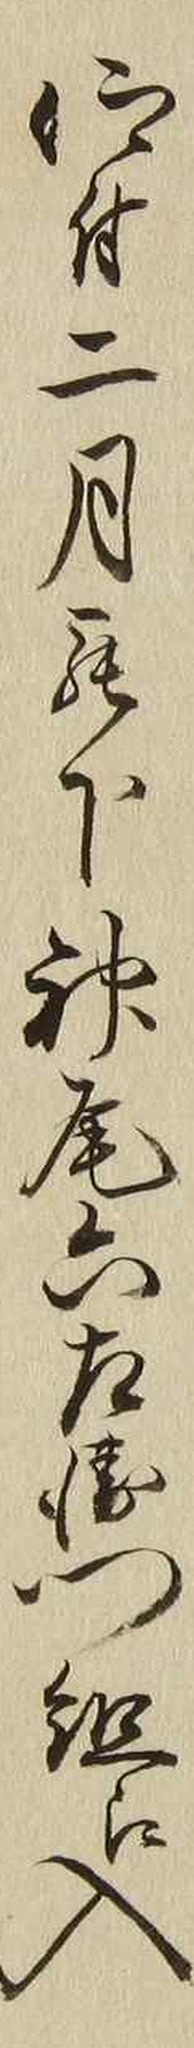仰付二月罷下神尾六左衛門組江入
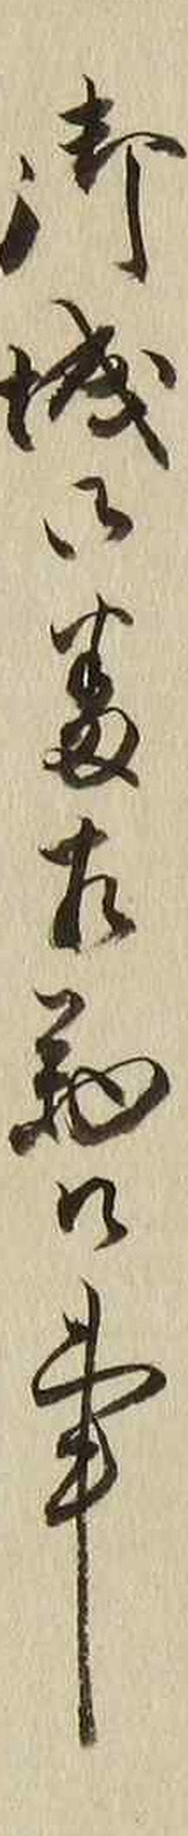御城御番相勤候事
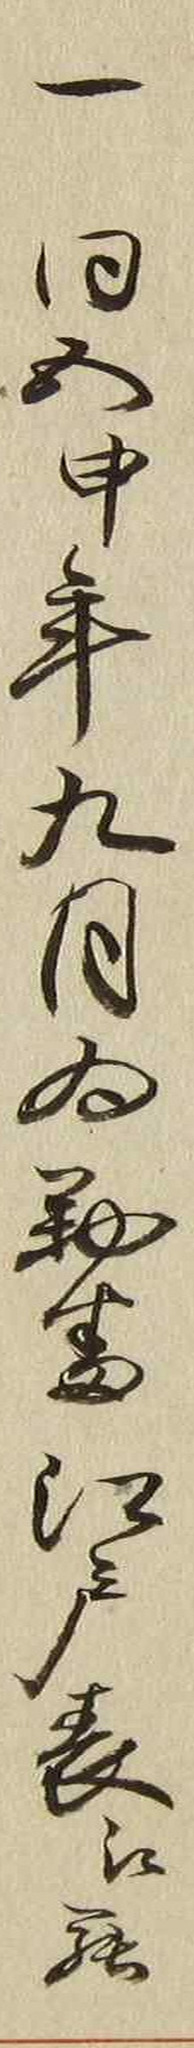一同五申年九月為勤番江戸表江罷
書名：諸士系譜　巻之60　と之部3
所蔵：会津若松市立会津図書館
